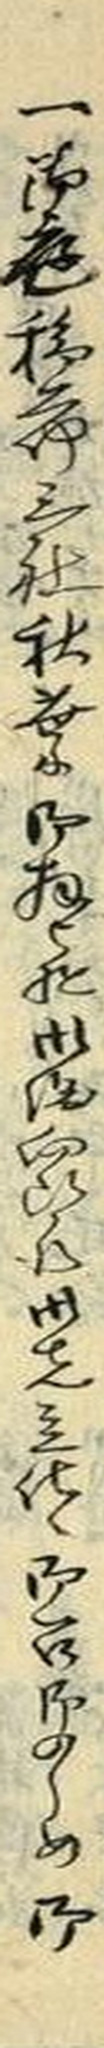一御庭稲荷三社秋葉社御拝被遊御側向頭取御先立仕候御召御のしめ御
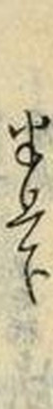半上下
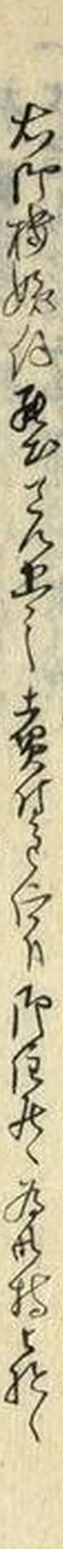右御機嫌伺罷出差上之煮付被仰付御住居へ為御持被遊候
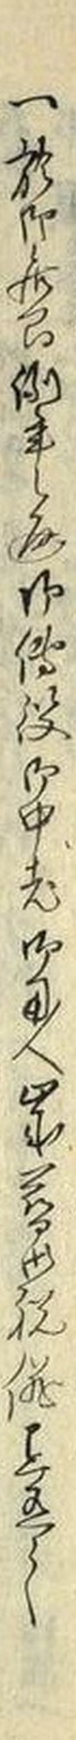一於御居間例年之通御傅役御中老御用人歳暮御祝儀申上有之
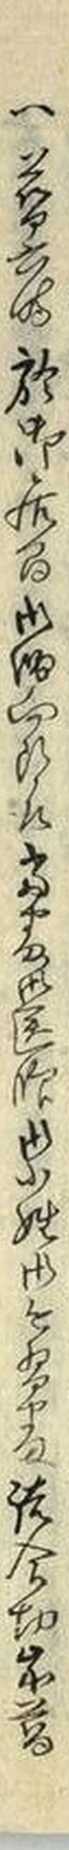一暮六時於御居間御側向頭取当番御医師御小姓御近習番詰合切歳暮
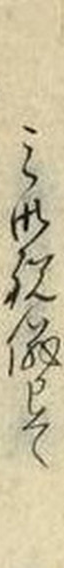之御祝儀申上候
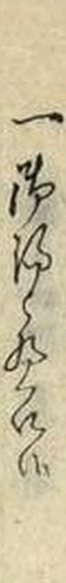一御湯被為召候
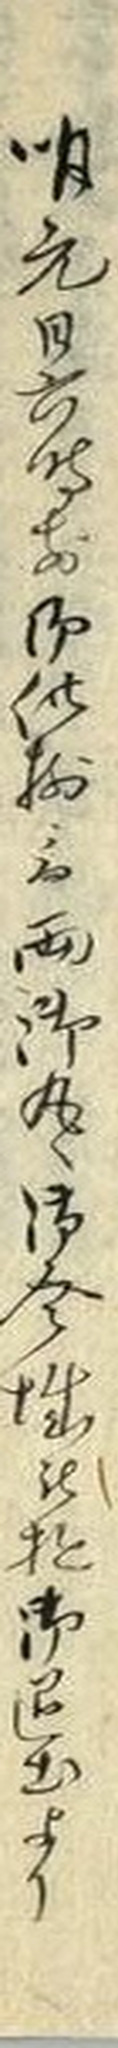明元旦六時前御供揃ニ而両御丸へ御登城被遊御退出より
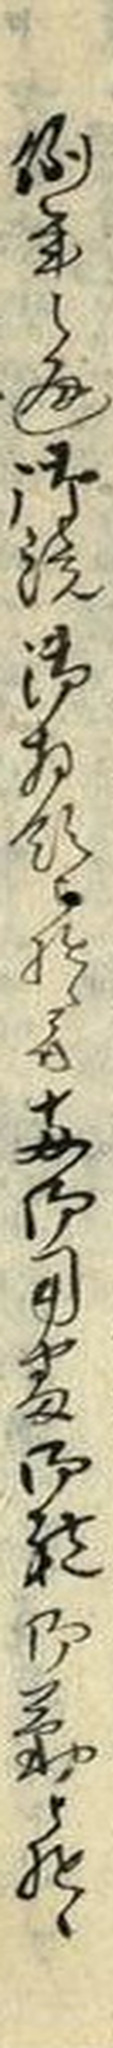例年之通御鏡御拝領被遊候ニ付両御用番御礼御勤被遊候
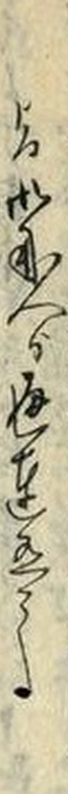旨御用人ゟ通達有之
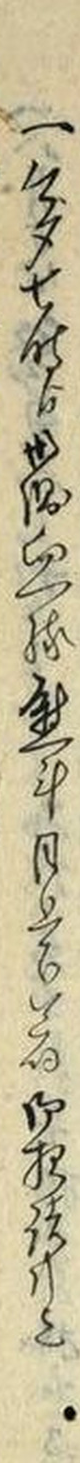一今夕七時ゟ御側向一統熨斗目上下着御夜詰引迄
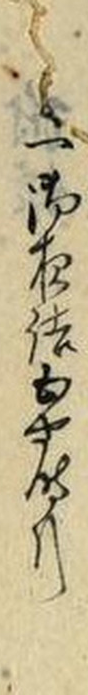一御夜詰五半時引

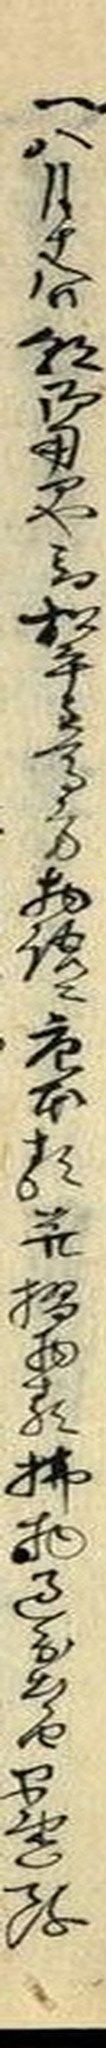一八月十八日朝御用部やニ而松平主馬方物語ニ唐本類并摺物類払物過分出候由早速致
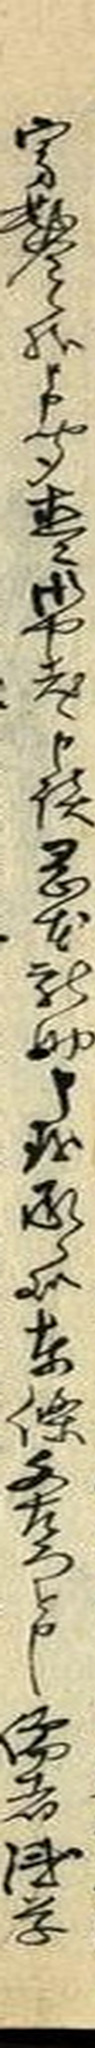穿鑿候様被申聞直々御中老へ申談岡本新助申越承候処東條文左衛門と申儒者浅草
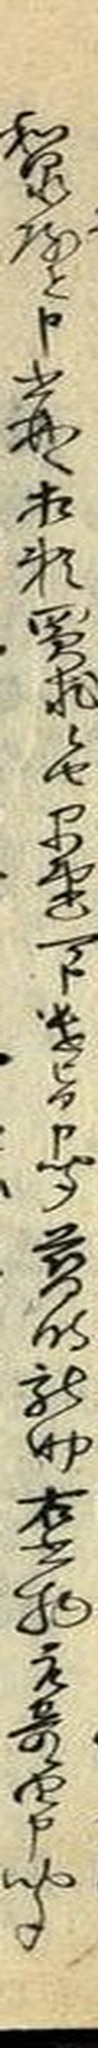和泉屋と申書林へ相頼買求候由早速可申遣旨申聞暮時新助右書物取寄候由申聞
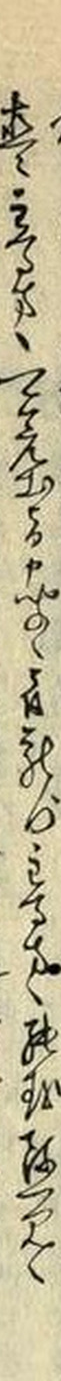直々主馬方へ可差出旨申聞候ニ付新右衛門主馬方へ罷越致一見候
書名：少傅日録抄（斉承付側向頭取日記、在府）
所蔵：福井県文書館 Fukui Prefectural Archives
